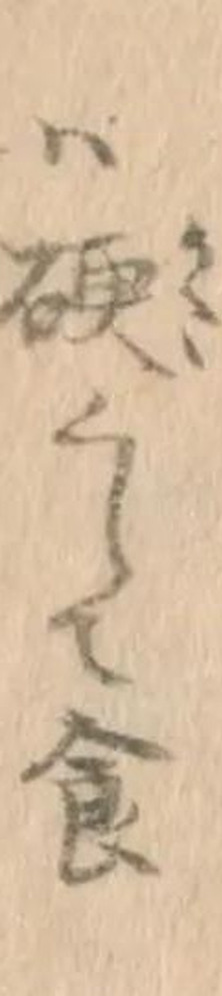は硬くして食
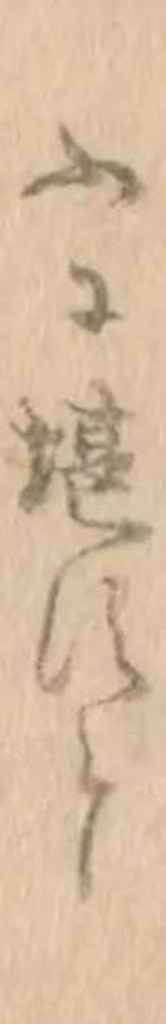ふに堪すと
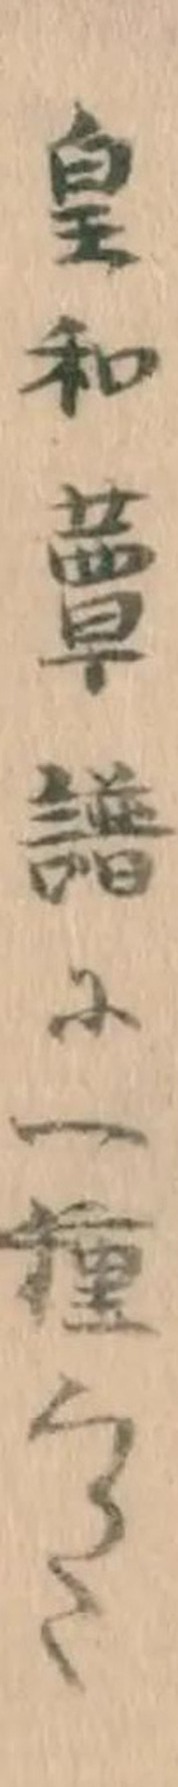皇和蕈譜に一種くりた
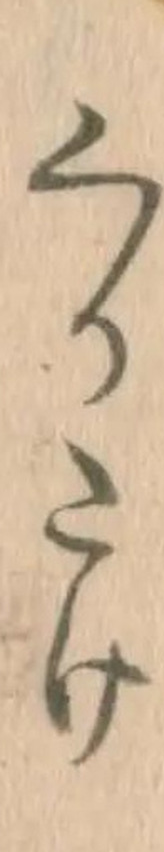くりたけ
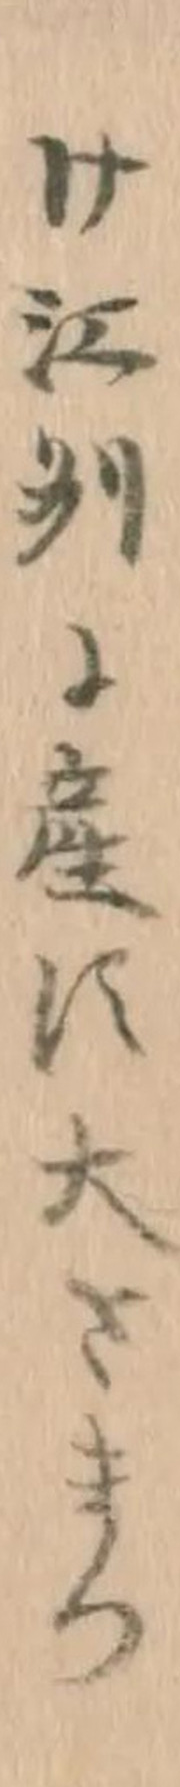け江州に産す大さまつ
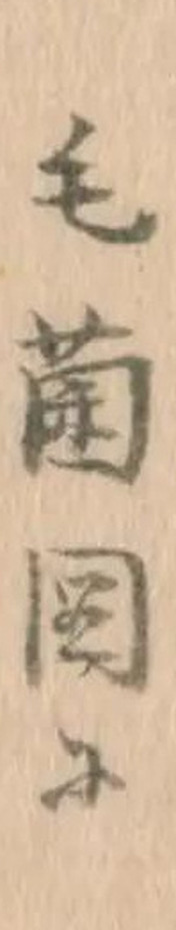毛菌図に
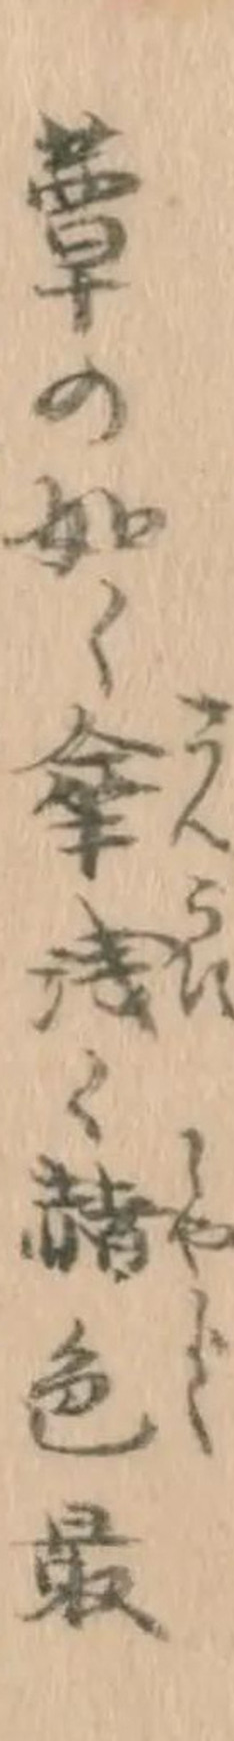蕈の如く傘浅く赭色最
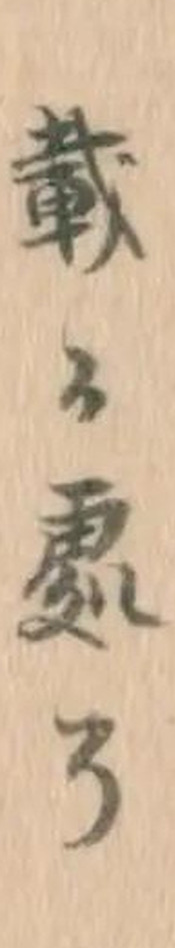載る処ろ
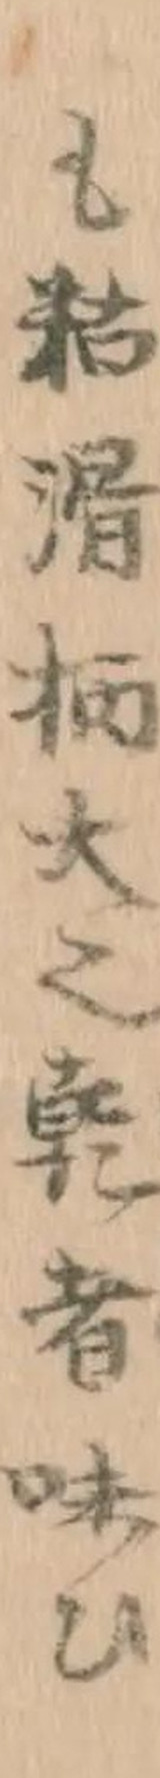も粘滑柄大也乾者味ひ
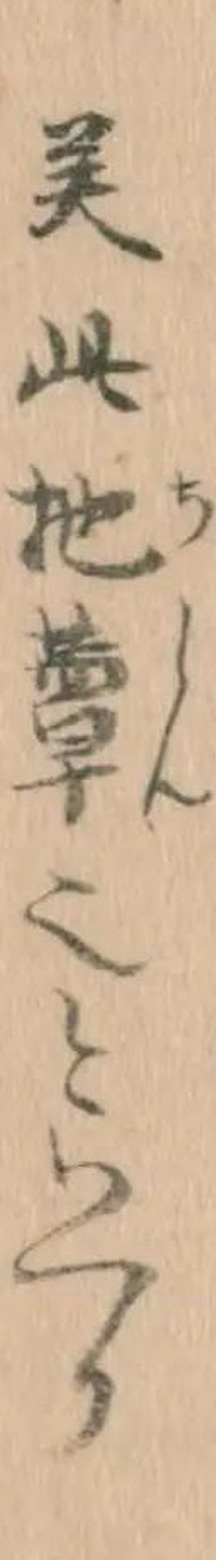美此地蕈也といへり
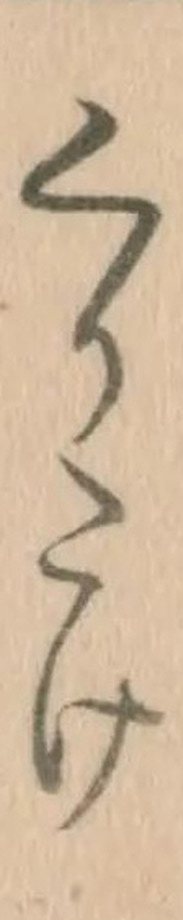くりたけ
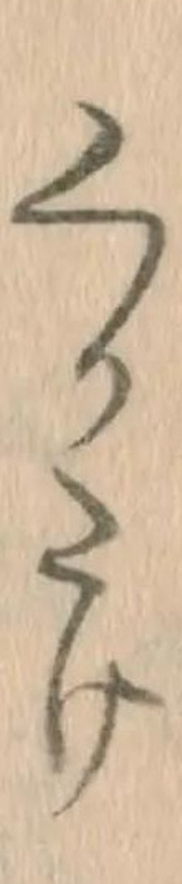くりたけ
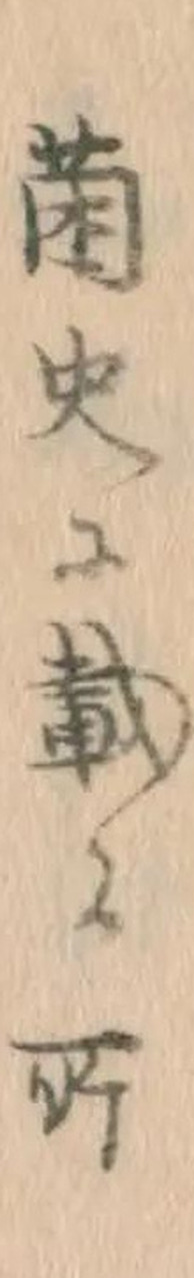菌史に載る所
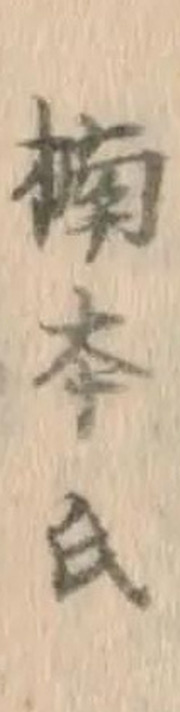楠本氏
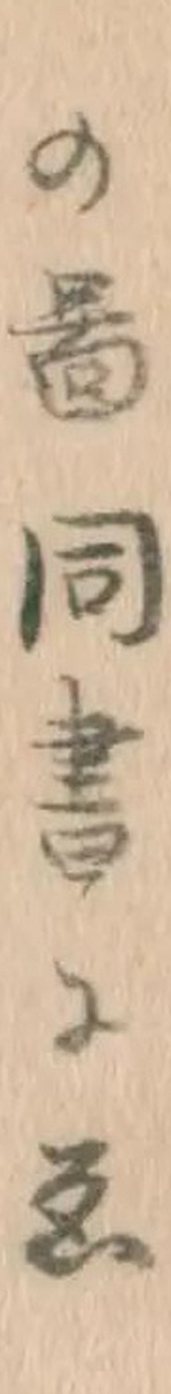の図同書にゑ
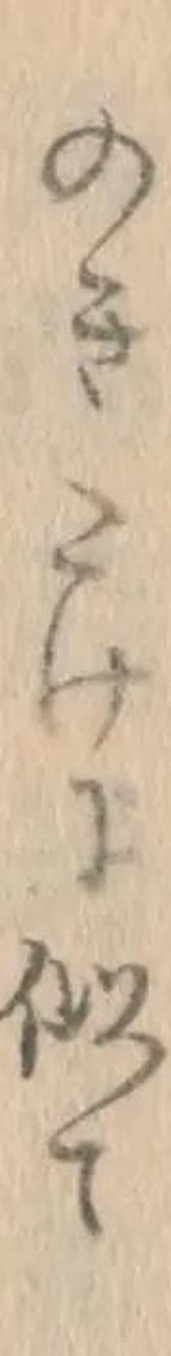のきたけに似て
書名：本草図譜. 巻55-57
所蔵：国立国会図書館 National Diet Library, JAPAN
